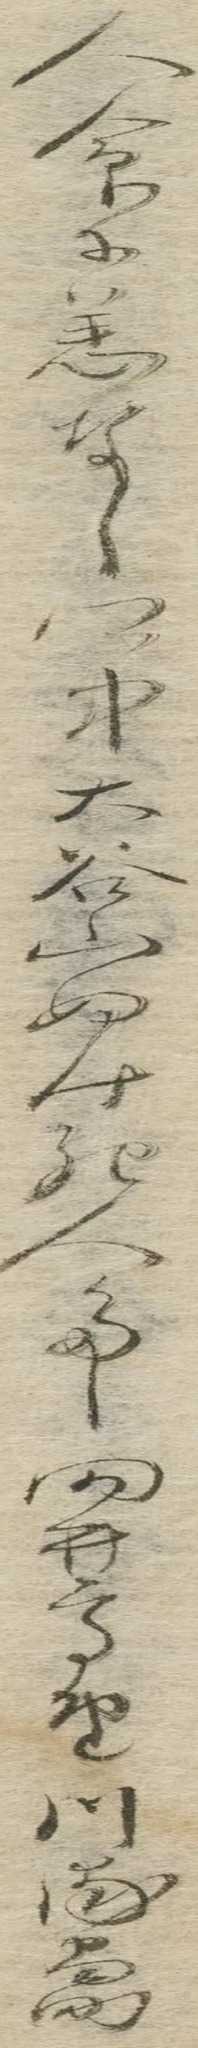人命に恙なし郷中大谷山ぬけ死人多し田井高野川浦当町
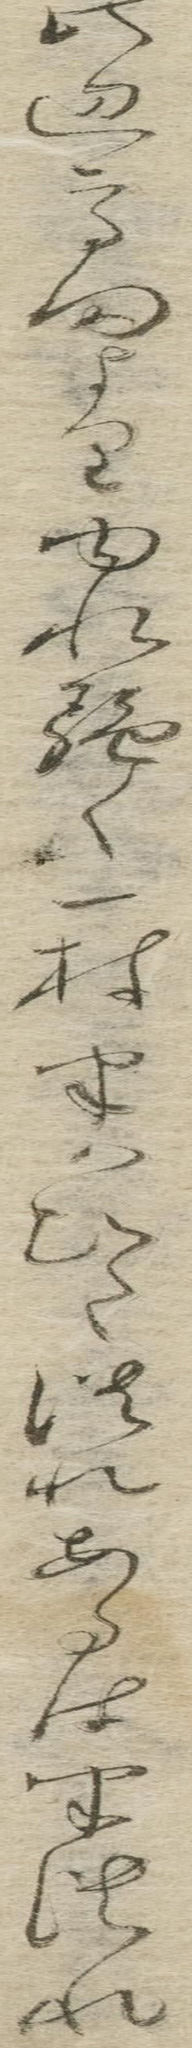此辺高田よりゆれ強く一村半ハひた潰れあるは半潰れ
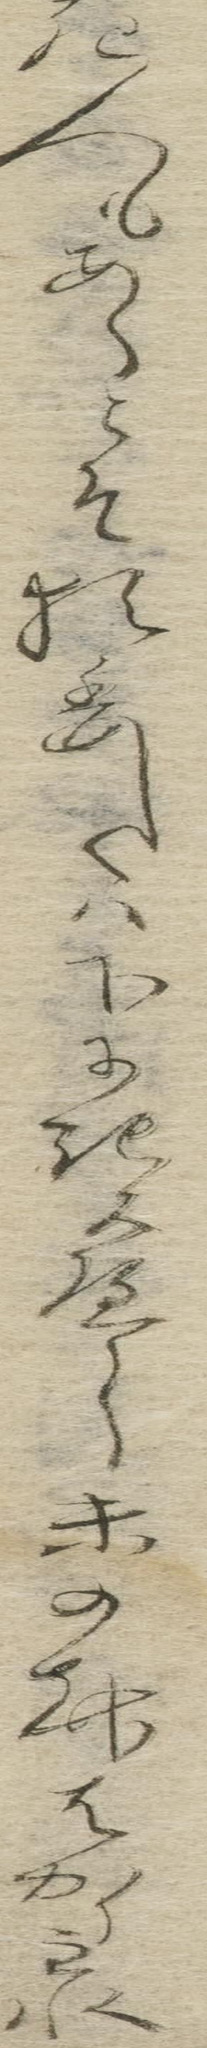死人もありとそ猶委しくハ下に記スへし未の斎はかり収

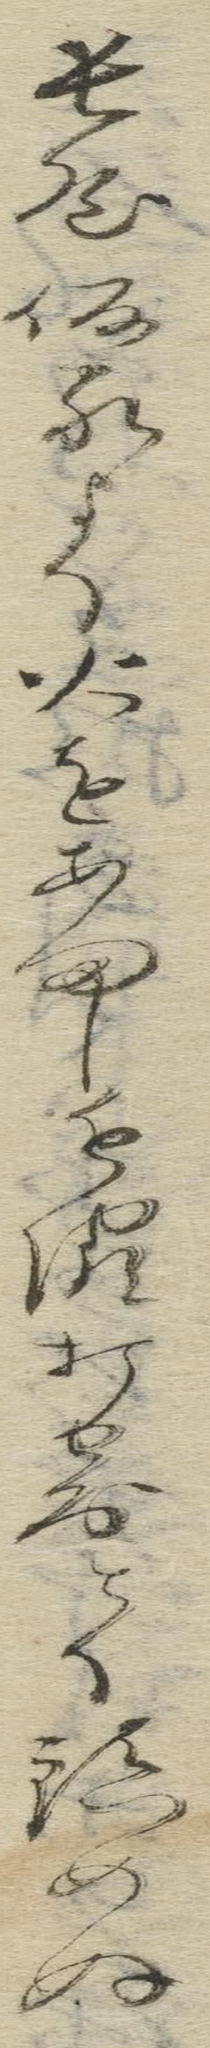長屋仮家より火をあまし近隣打寄とく鎮めぬ
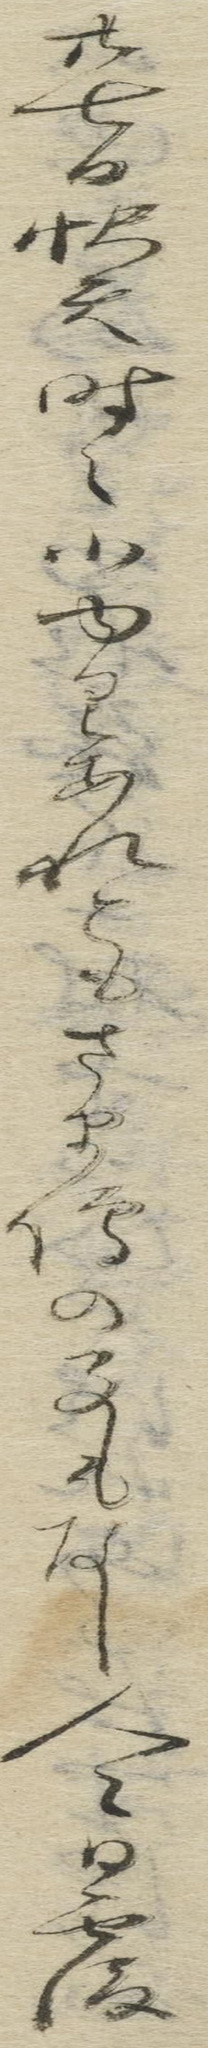廿七日快天時々小ゆりあれともさまてのこともなし人々日覆
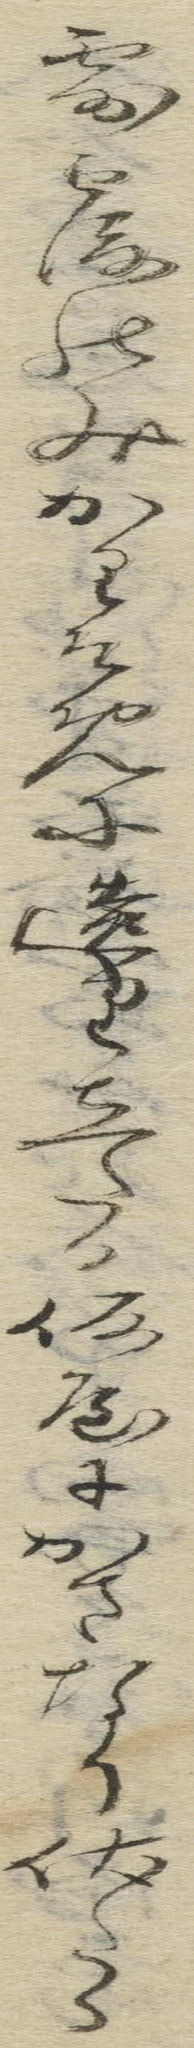露覆のみかりそめに造り立たる仮屋にかさなり伏たる
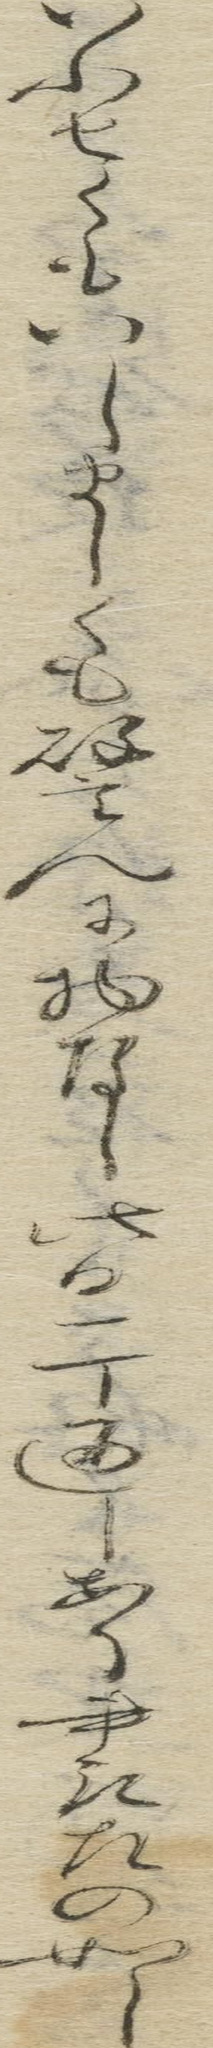いふせくもいしましくも譬んに物なし此日一丁通しあり事記左の如し
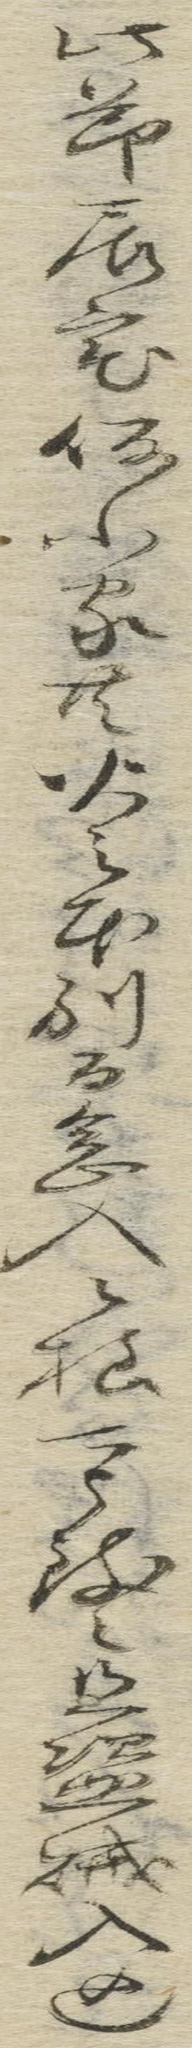此節居宅仮小家共火之本別而念入候様可被致候且盗賊入込
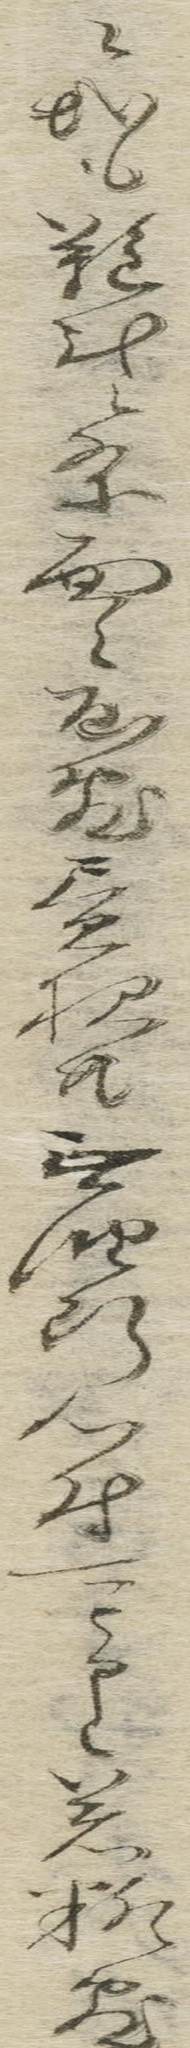候哉も難計候条面々屋敷昼夜共無油断心付可被申候若紛敷
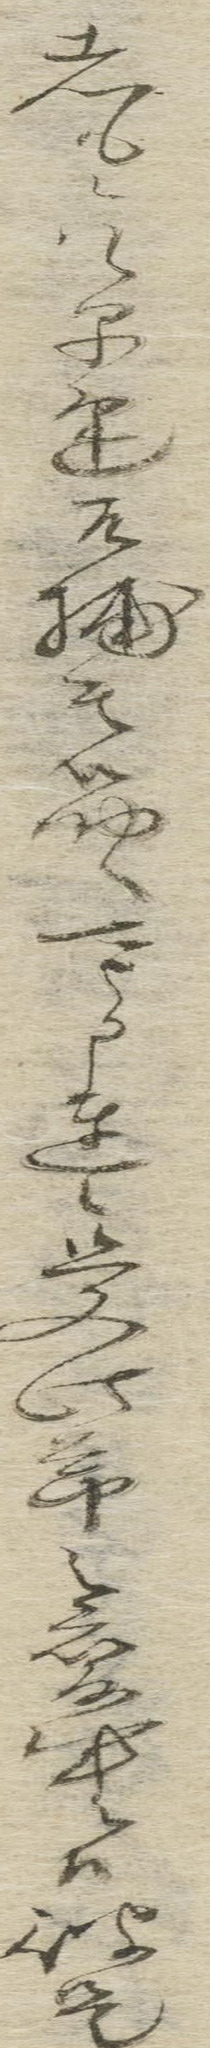者も候ハゝ早速召捕其筋へ可被申達候且又此節之変事二付彼是
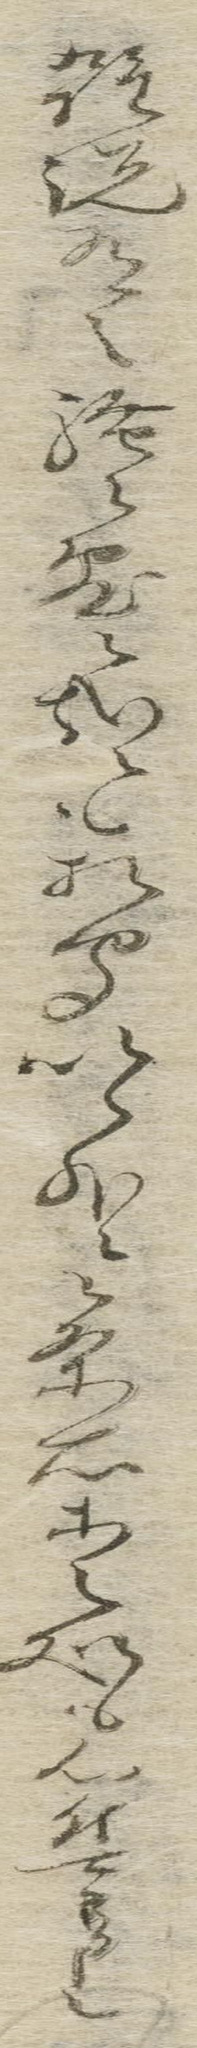雑説有之騒々敷候哉二も相聞以之外二候条右等之処も心付可被申候
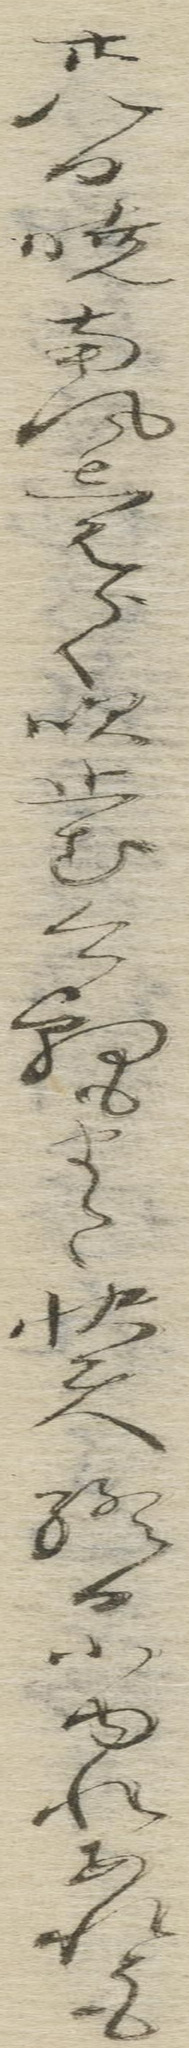廿八日暁南風しはらく吹止む今朝もまた快天終日小ゆれあれとも
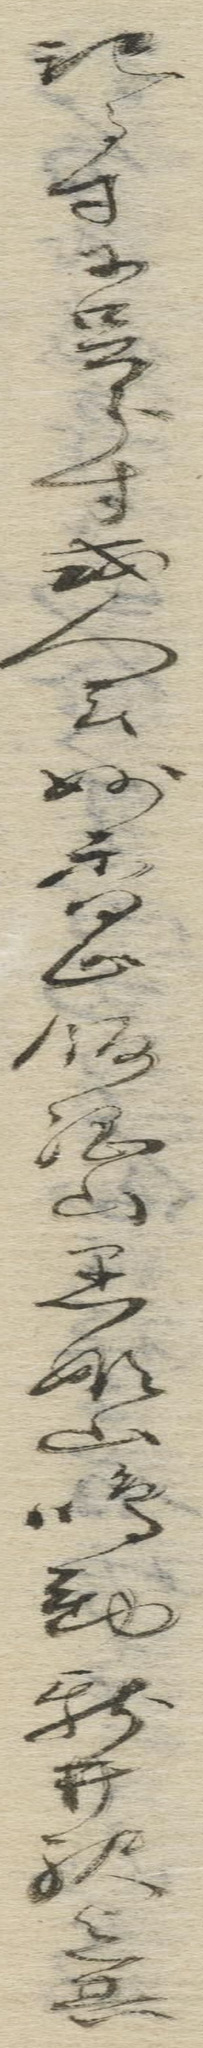記るすにハあらす或人云妙香山飯綱山黒姫山鳴動新井駅迄其
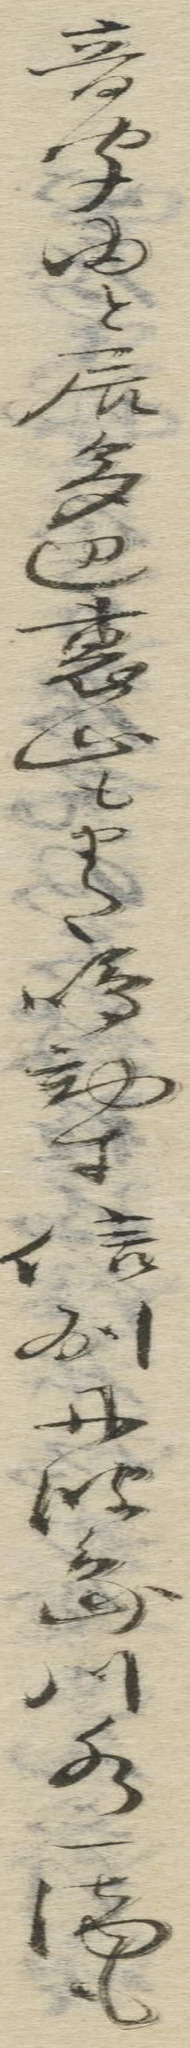音聞ゆと居多辺裏山もまた鳴動す信州丹波島川水一滴も
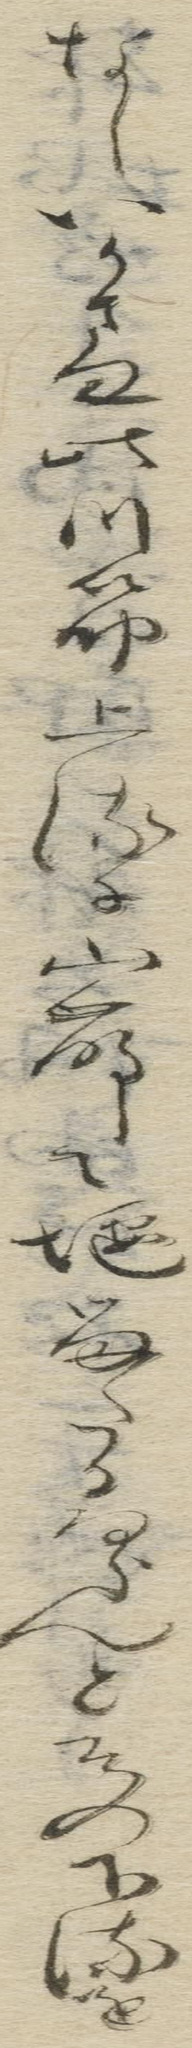なしいりまた此川筋上流に山崩して堰留たるならんとその下流の
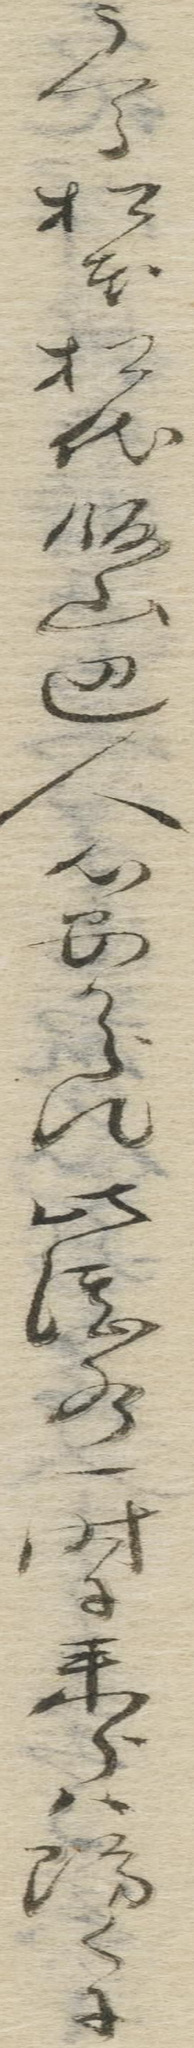うへに松本松代飯山辺人心安からす此流水一時に来らハ防くに
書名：弘化丁未天變日記
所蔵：東京大学地震研究所図書室 Earthquake Research Institute Library, The University of Tokyo, JAPAN
